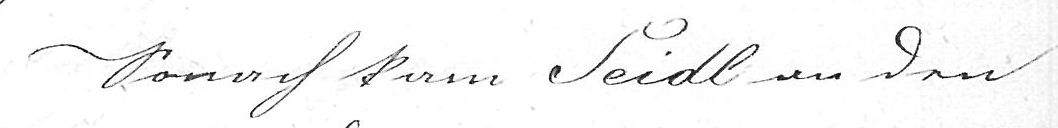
Sonach kann Seidl an den
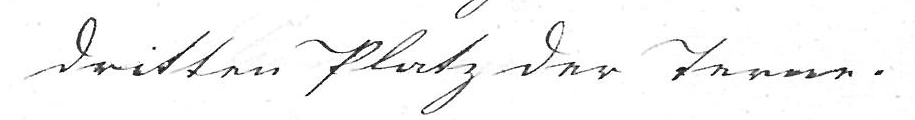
dritten Platz der Terne.
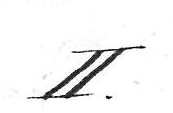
II.
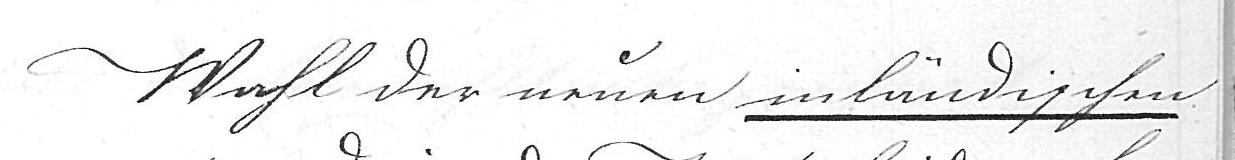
Wahl der neuen inländischen
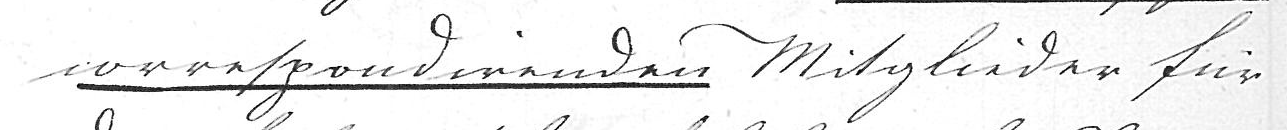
correspondirenden Mitglieder für
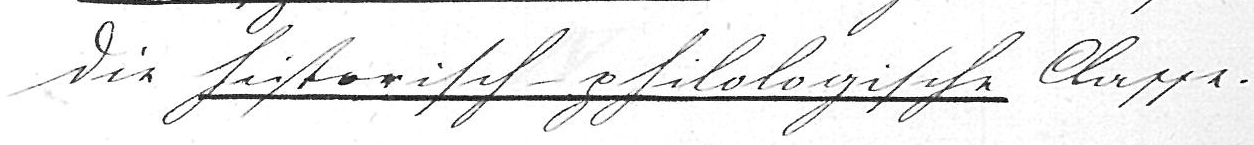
die historisch-philologische Classe.
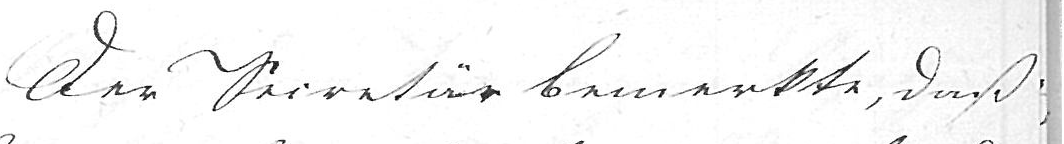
Der Secretär bemerkte, daß
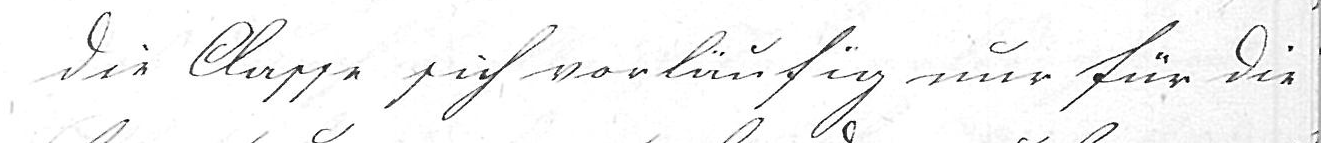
die Classe sich vorläufig nur für die
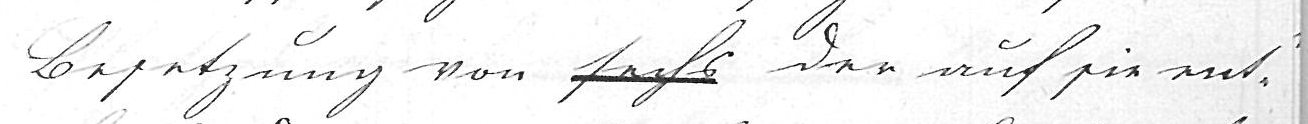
Besetzung von sechs der auf sie ent-
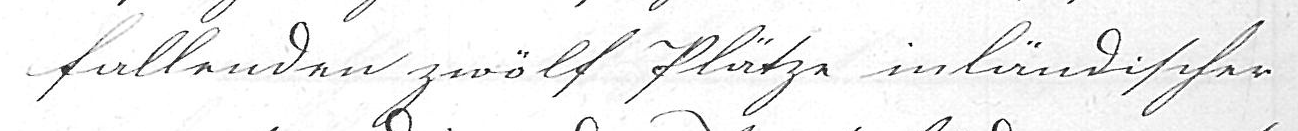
fallenden zwölf Plätze inländischer
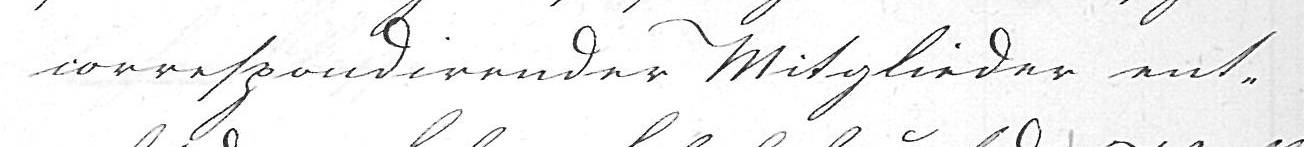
correspondirender Mitglieder ent-
